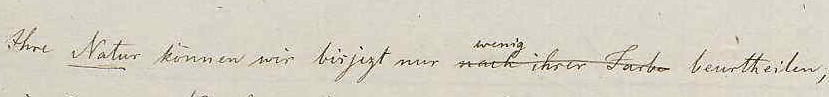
Ihre Natur können wir bis jezt nur nach ihrer Farbewenig beurtheilen,
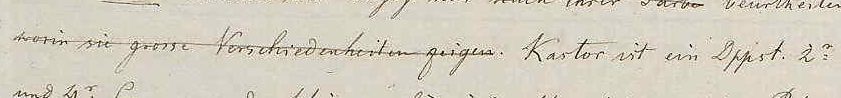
worin sie grosse Verschiedenheiten zeigen. Kastor ist ein Dpp.stern 2￼
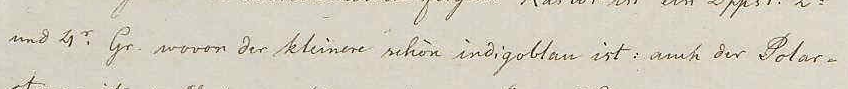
und 4￼ Gr. wovon der kleinere schön indigoblau ist: auch der Polar-
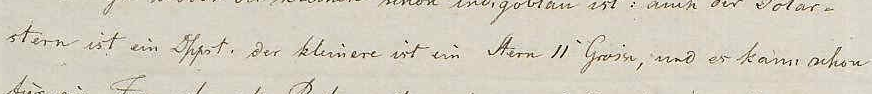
stern ist ein Dppst. der kleinere ist ein Stern 11￼ Grösse, und es kann schon
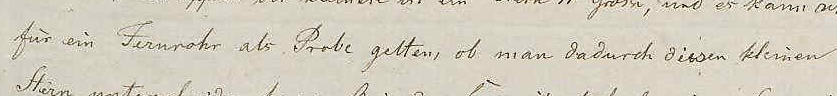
für ein Fernrohr als Probe gelten, ob man dadurch diesen kleinen
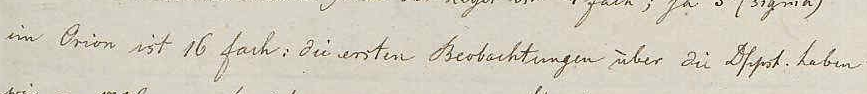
im Orion ist 16 fach: die ersten Beobachtungen über die Dppst. haben
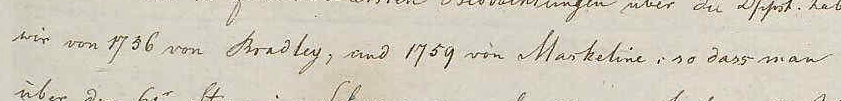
wir von 1736 von Bradley, und 1759 von Maskeline: so dass man
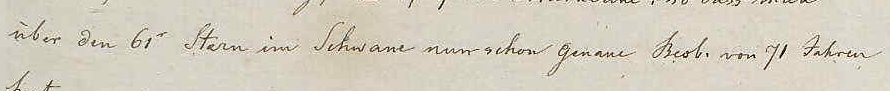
über den 61￼ Stern im Schwane nun schon genaue Beob. von 71 Jahren
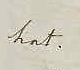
hat.
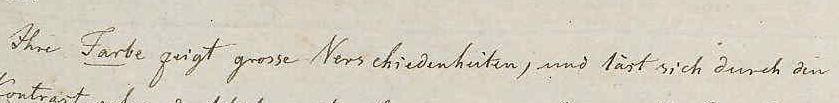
Ihre Farbe zeigt grosse Verschiedenheiten, und läst sich durch den
